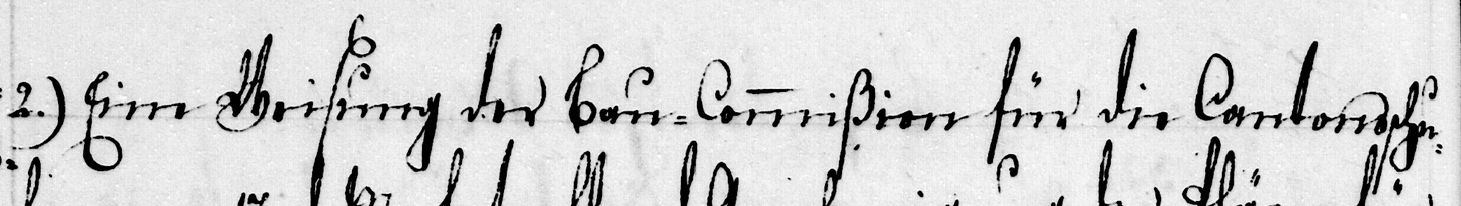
2.) Eine Weisung der Bau-Commißion für die Cantonsschu¬
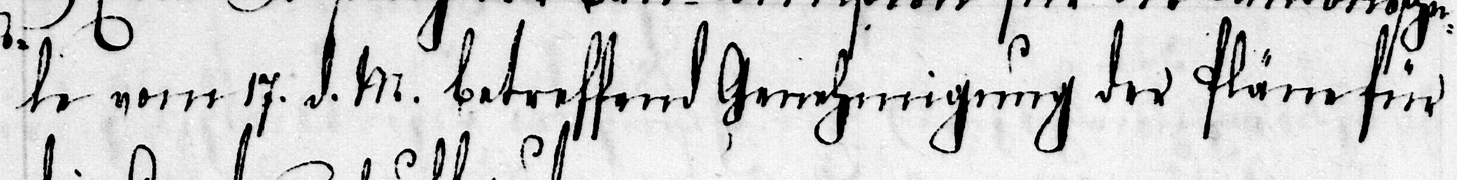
le vom 17. d. M. betreffend Genehmigung der Pläne für
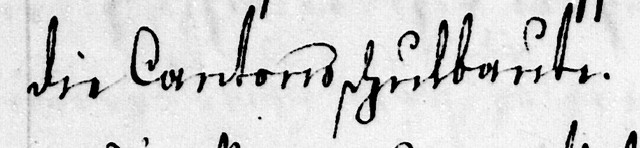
die Cantonsschulbaute.
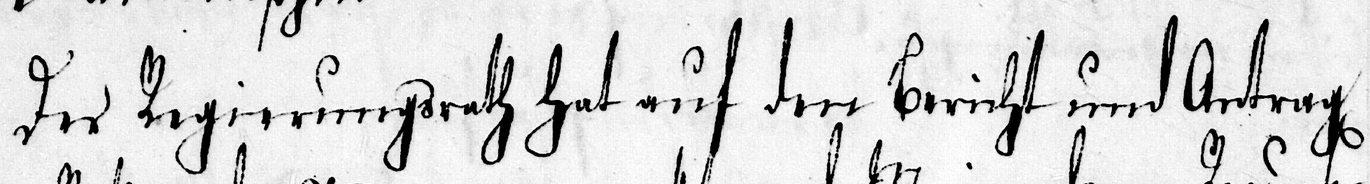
Der Regierungsrath hat auf den Bericht und Antrag
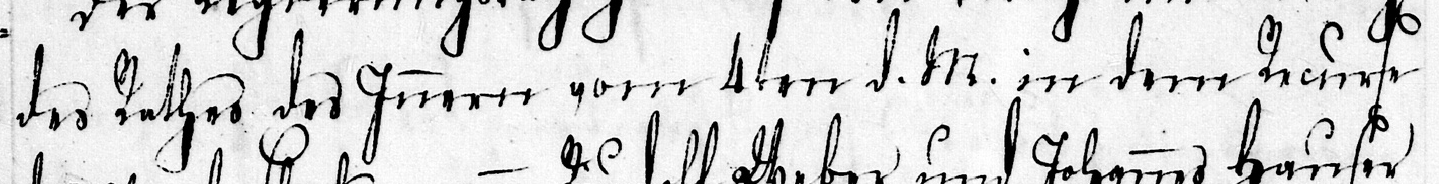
des Rathes des Innern vom 4ten d. M. in dem Recurse
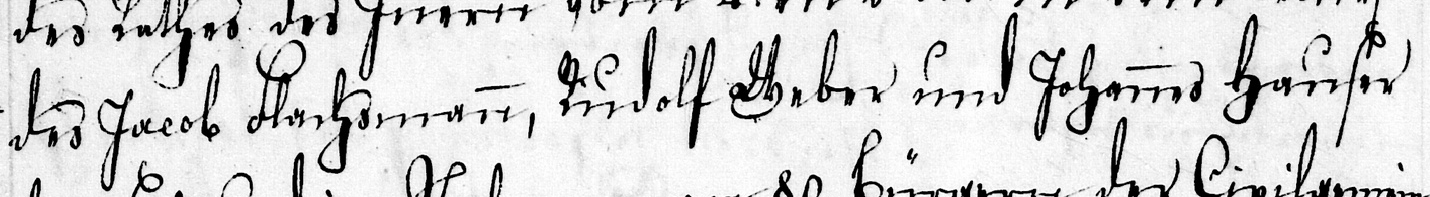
des Jacob Flachsmann, Rudolf Weber und Johannes Hauser
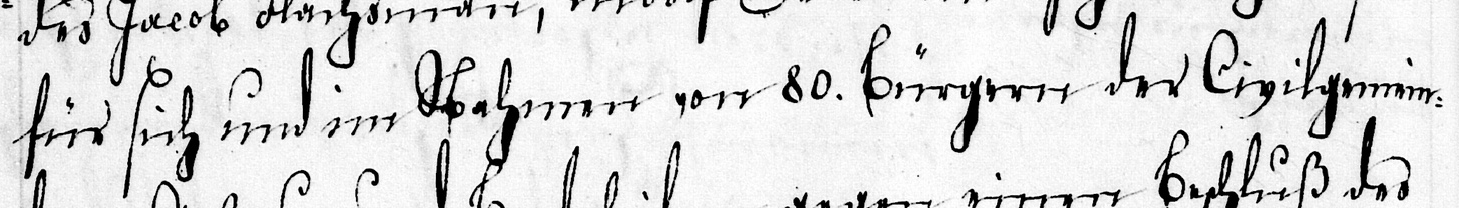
für sich und im Nahmen von 80. Bürgern der Civilgemein¬
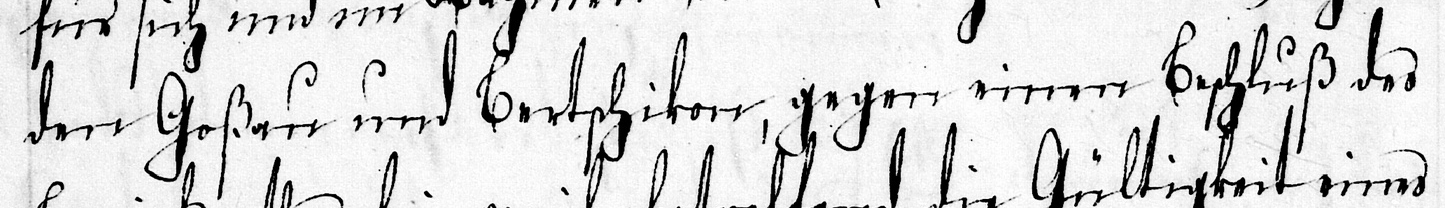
den Goßau und Bertschikon, gegen einen Beschluß des
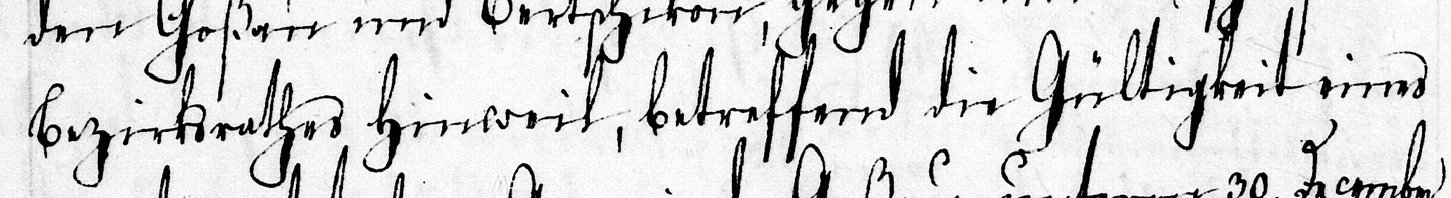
Bezirksrathes Hinweil, betreffend die Gültigkeit eines
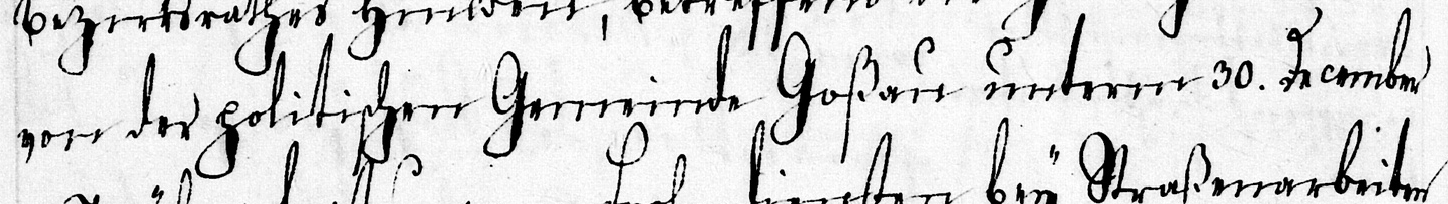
von der politischen Gemeinde Goßau unterm 30. December
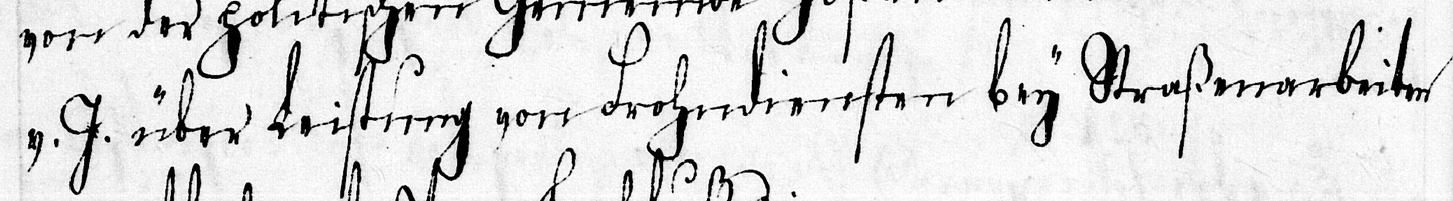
v. J. über Leistung von Frohndiensten bey Straßenarbeiten
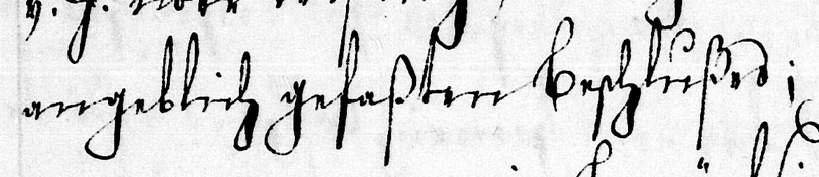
angeblich gefaßten Beschlußes;
